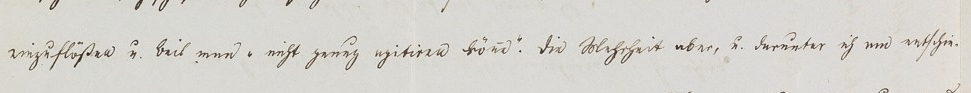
einzuflößen u. weil man «nicht genug agitiren könne.» Die Mehrheit aber, u. darunter ich am entschie-
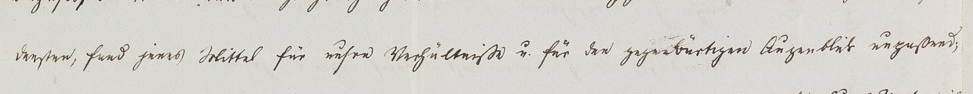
densten, fand jenes Mittel für unsre Verhältniße u. für den gegenwärtigen Augenblick unpaßend;
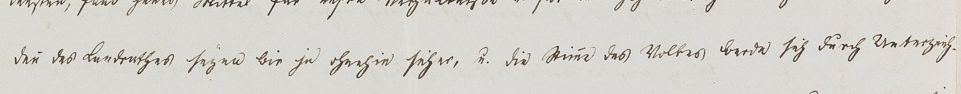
denn des Landrathes seyen wir ja ohnehin sicher, u. die Stimme des Volkes werde sich durch Unterzeich-
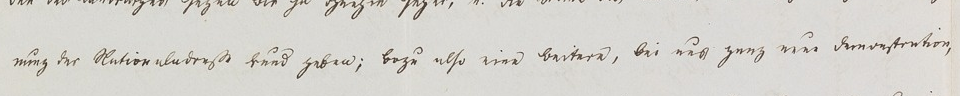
nung der Nationaladreße kund geben; wozu also eine weitere, bei uns ganz neue Demonstration,
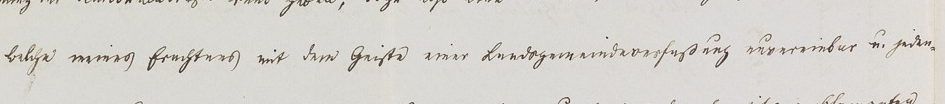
welche meines Erachtens mit dem Geiste einer Landsgemeindeverfaßung unvereinbar u. jeden-
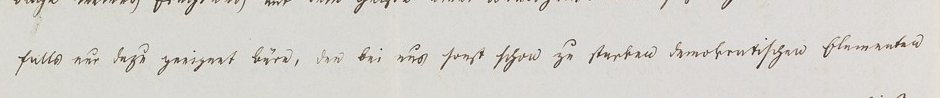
falls nur dazu geeignet wäre, den bei uns sonst schon zu starken demokratischen Elementen
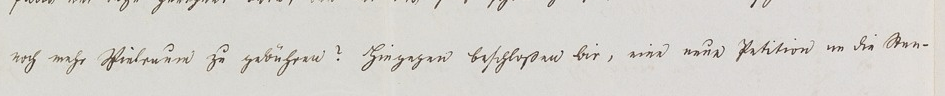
noch mehr Spielraum zu gewähren? Hingegen beschloßen wir, eine neue Petition an die Stan-
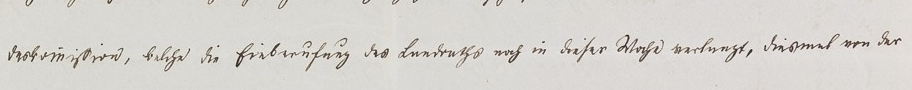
deskommißion, welche die Einberufung des Landraths noch in dieser Woche verlangt, diesmal von der
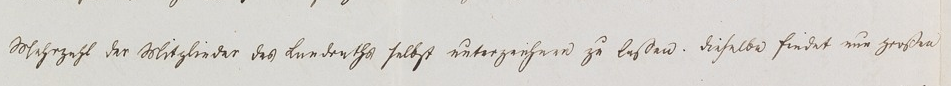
Mehrzahl der Mitglieder des Landraths selbst unterzeichnen zu laßen. Dieselbe findet nun großen
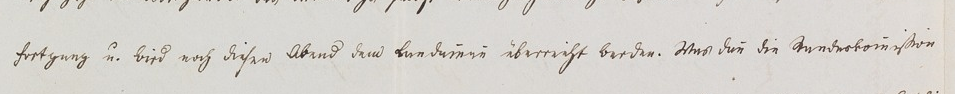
Fortgang u. wird noch diesen Abend dem Landammann überreicht werden. Was dann die Standeskommißion
